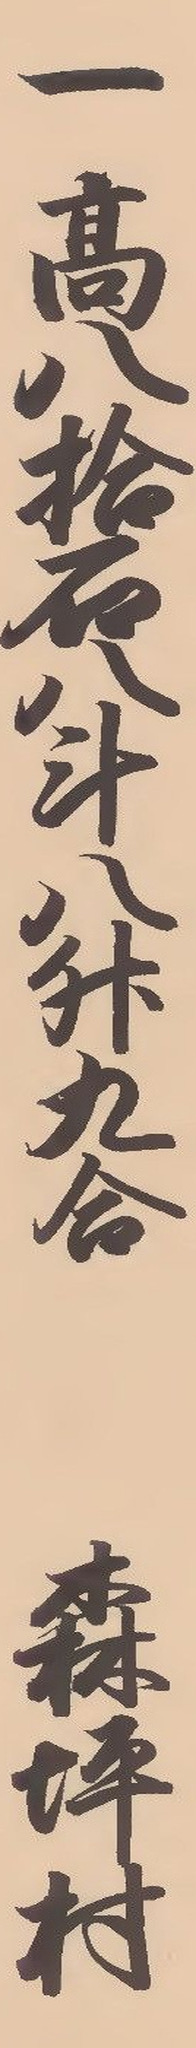一高八拾石八斗八升九合森坪村
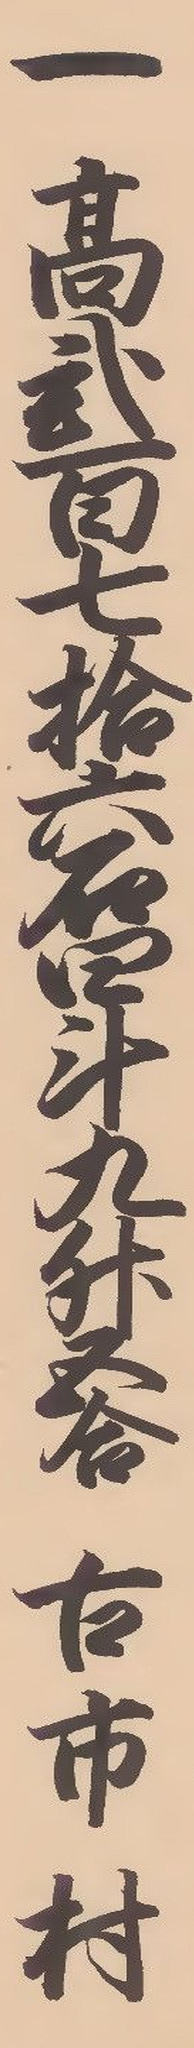一高弐百七拾六石四斗九升五合古市村

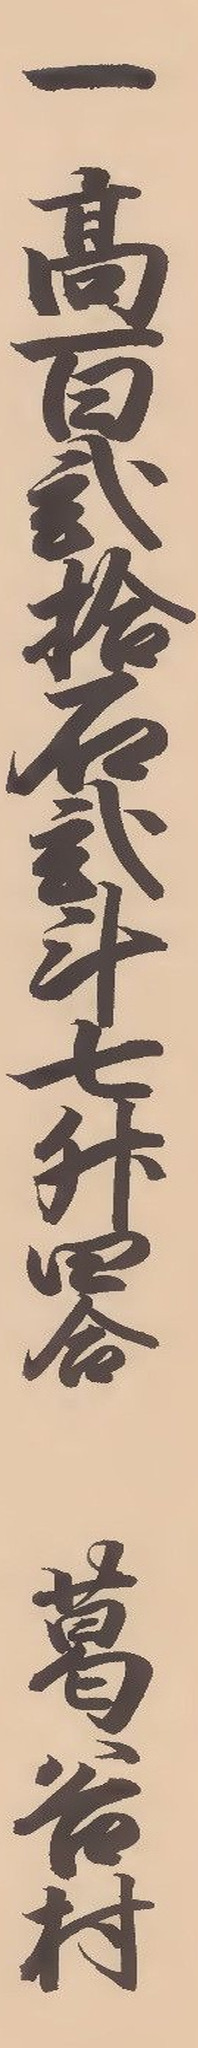一高百弐拾石弐斗七升四合葛谷村
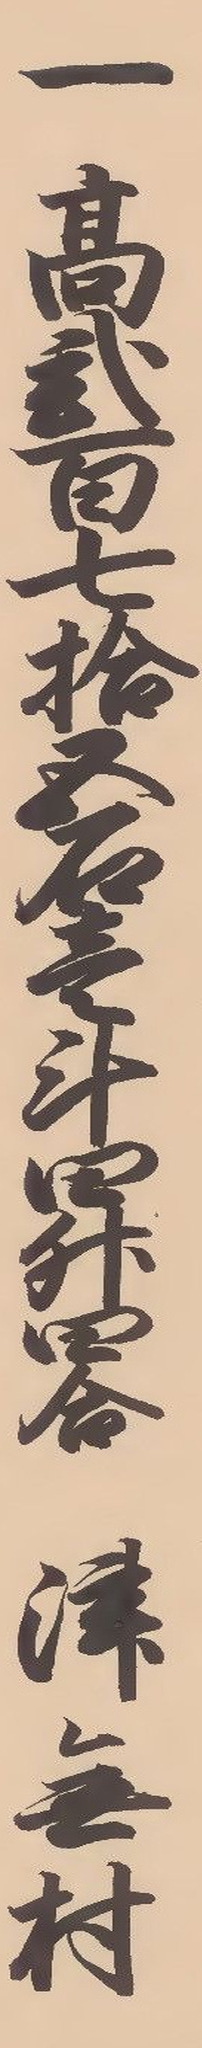一高弐百七拾五石壱斗四升四合津無村
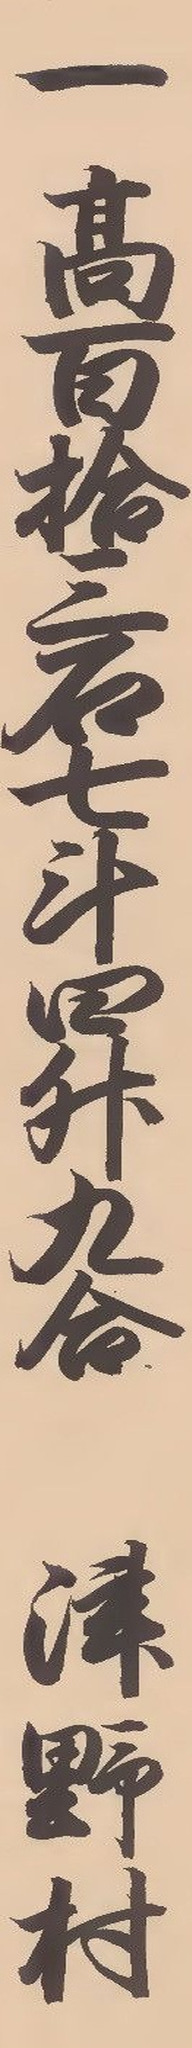一高百拾三石七斗四升九合津野村
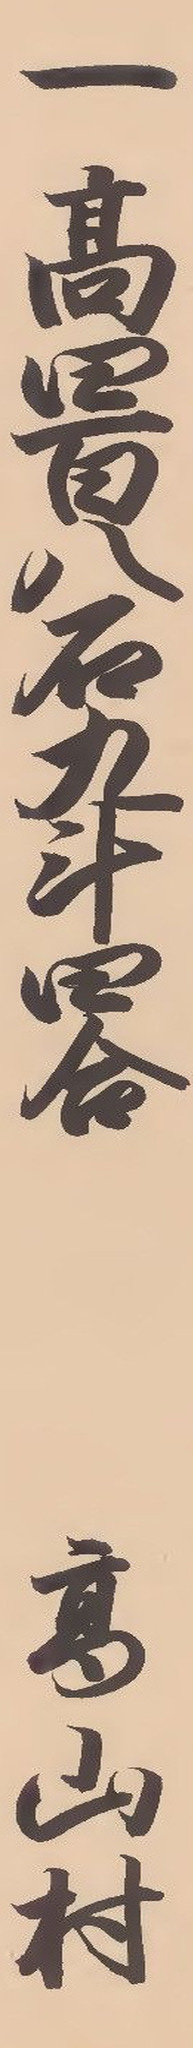一高四百八石九斗四合高山村
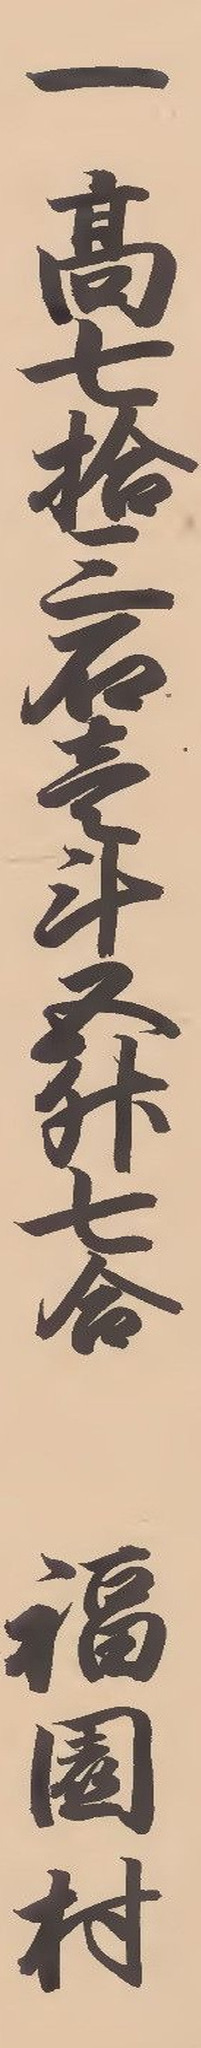一高七拾三石壱斗五升七合福園村
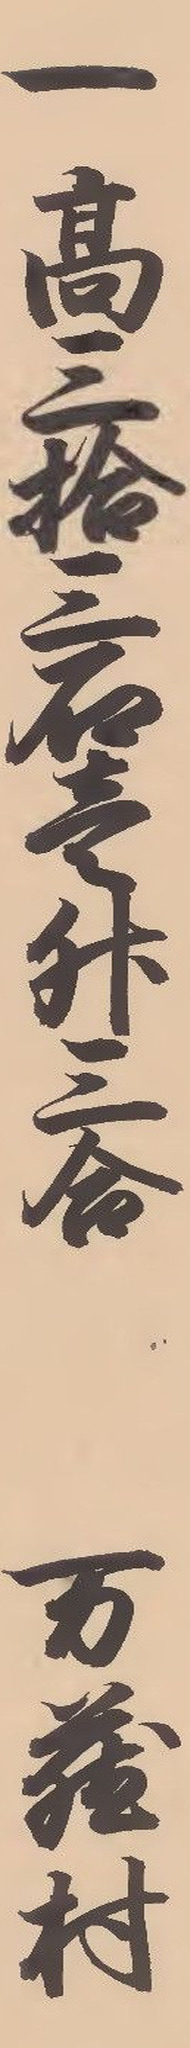一高三拾三石壱升三合万蔵村
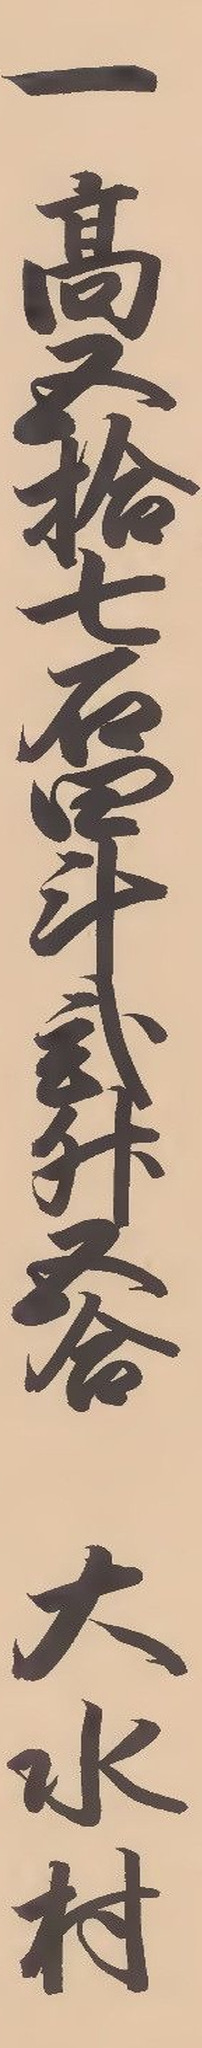一高五拾七石四斗弐升五合大水村
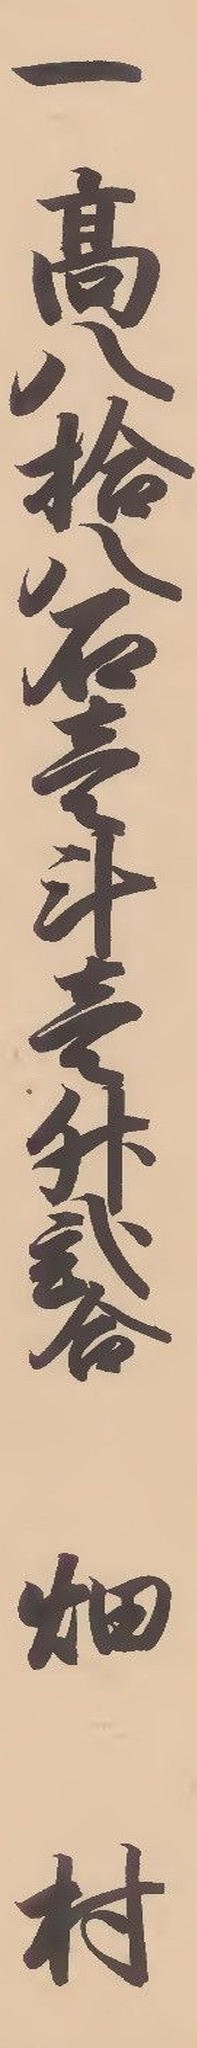一高八拾八石壱斗壱升弐合畑村

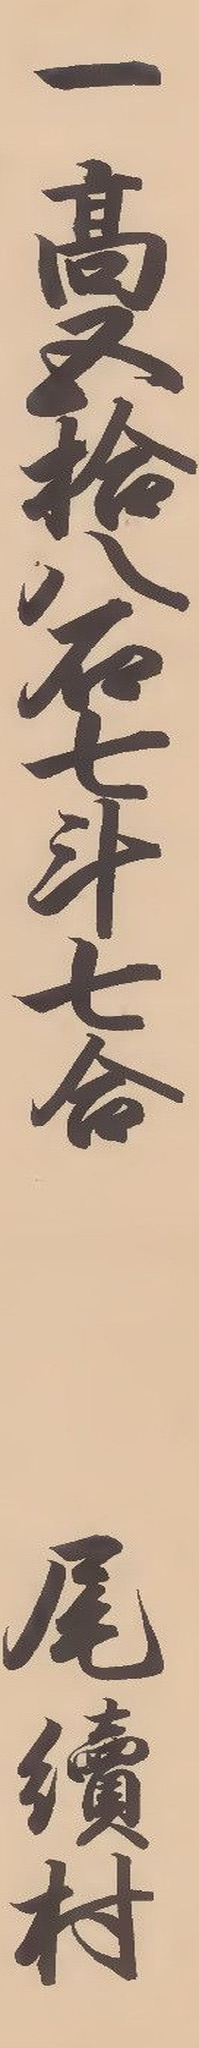一高五拾八石七斗七合尾続村
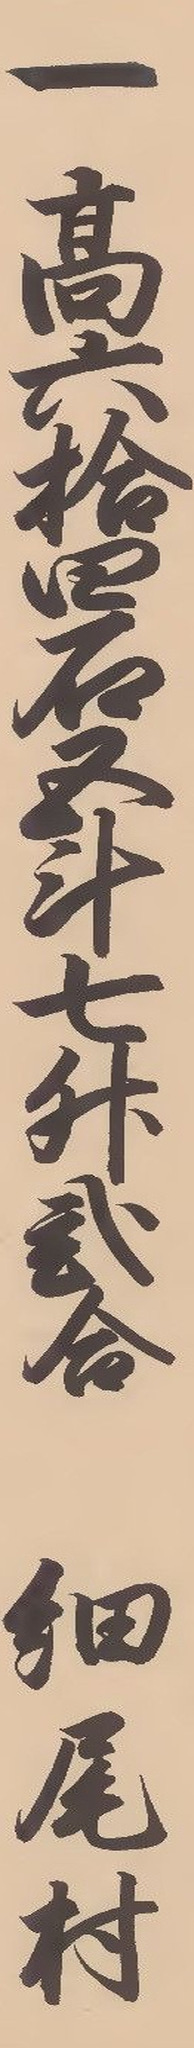一高六拾四石五斗七升弐合細尾村
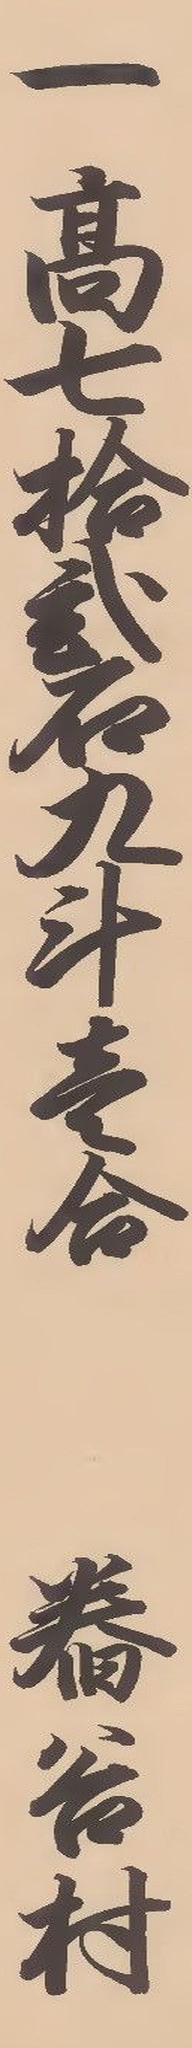一高七拾弐石九斗壱合舂谷村
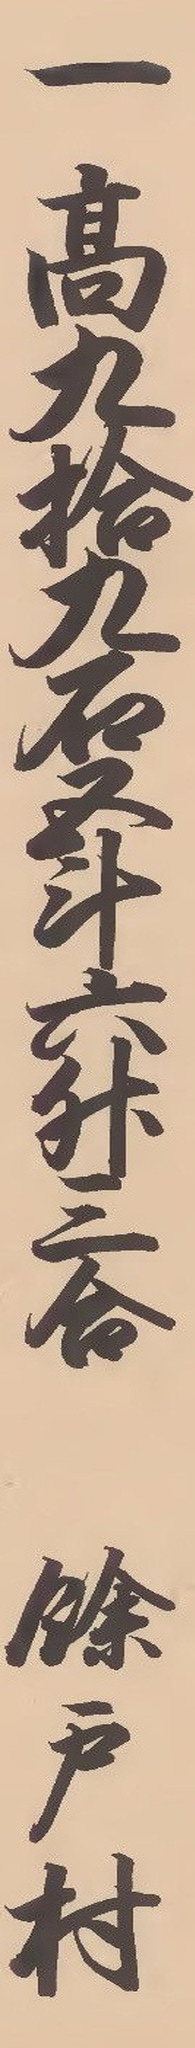一高九拾九石五斗六升三合余戸村
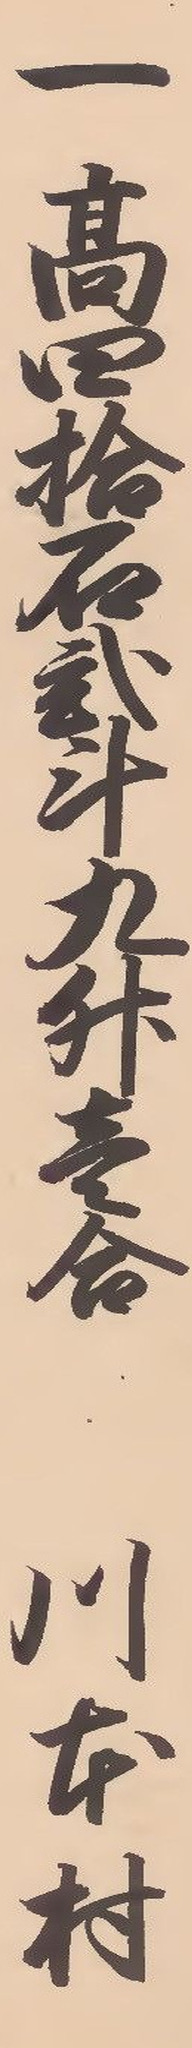一高四拾石弐斗九升壱合川本村
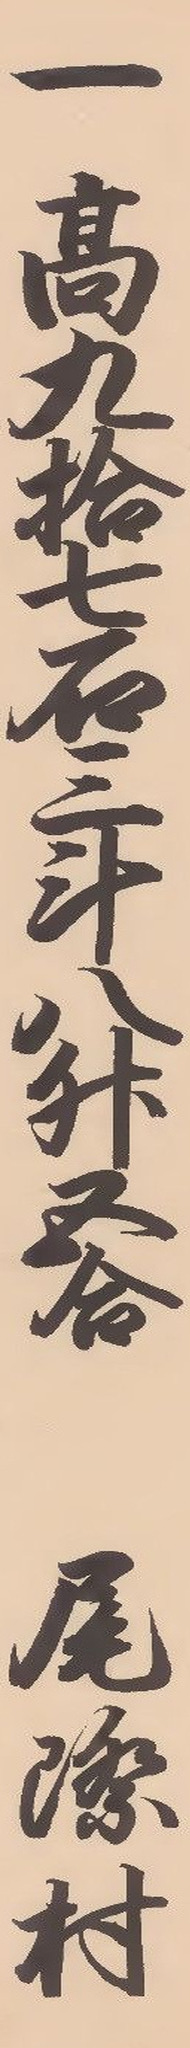一高九拾七石三斗八升五合尾際村
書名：因幡国郷帳
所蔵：国立公文書館 National Archives of Japan
